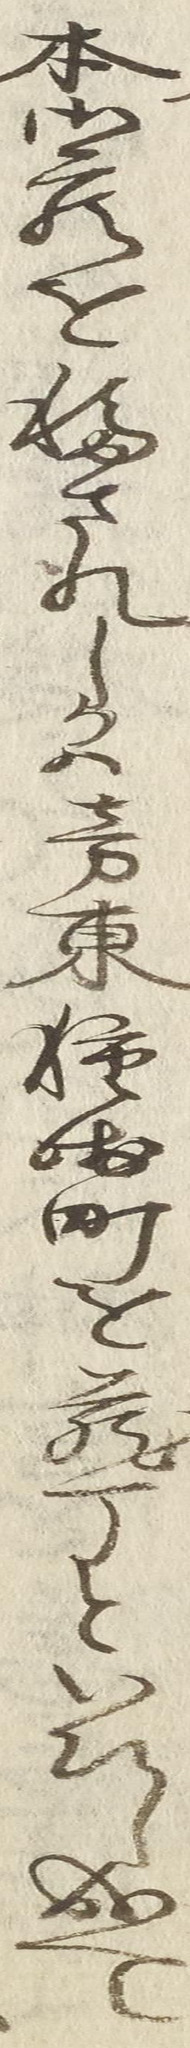本御蔵を移されしかは旁東種崎町を蔵丁といひし成へし
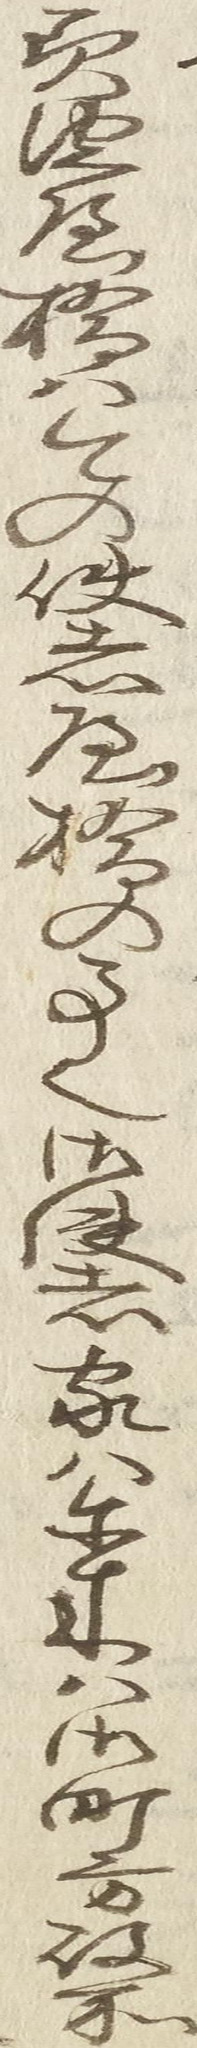美濃屋橋は今の使者屋橋の事也御使者家は尓来は御町方役所
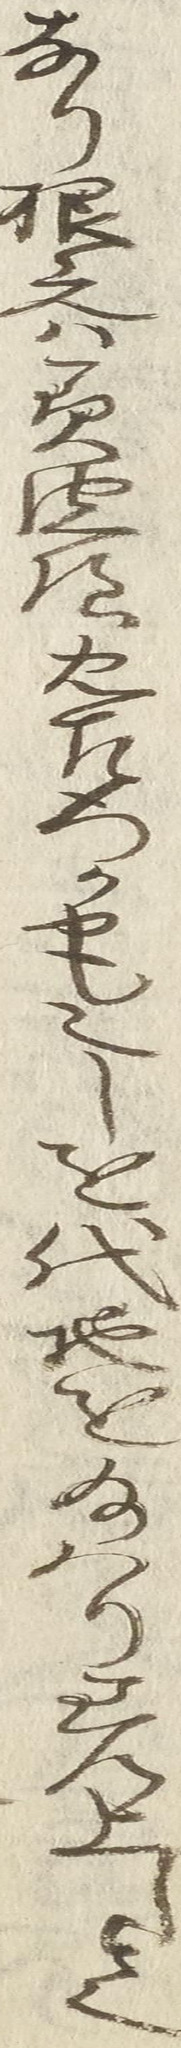なり根元は美濃屋忠左衛門か宅也しを代地を為はり差上し者也
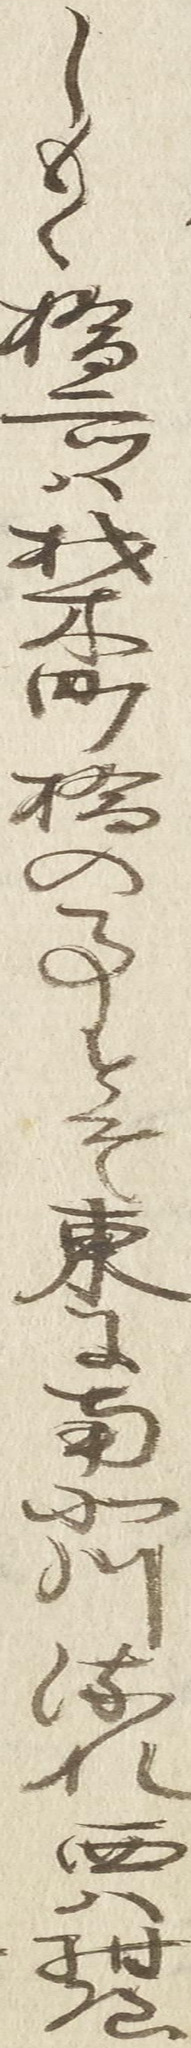しもく橋二ッは材木橋町橋の事とそ東に南北川流れ西は紺屋
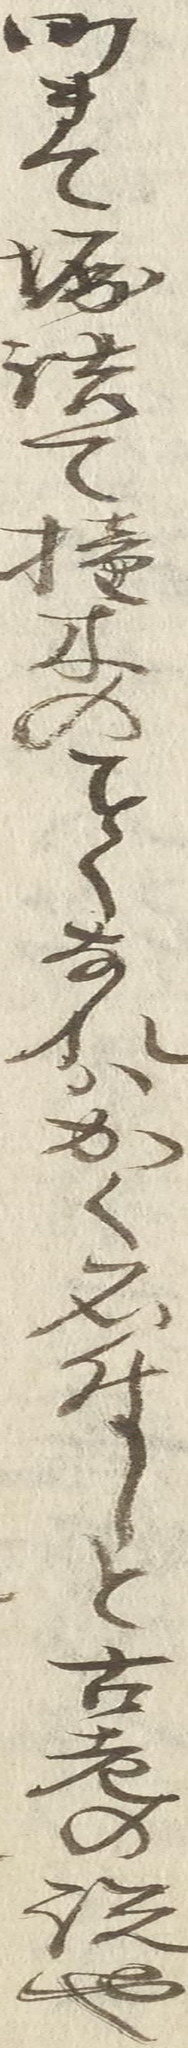町まで堀詰て撞木のことくなれはかく名付しと古老の説也
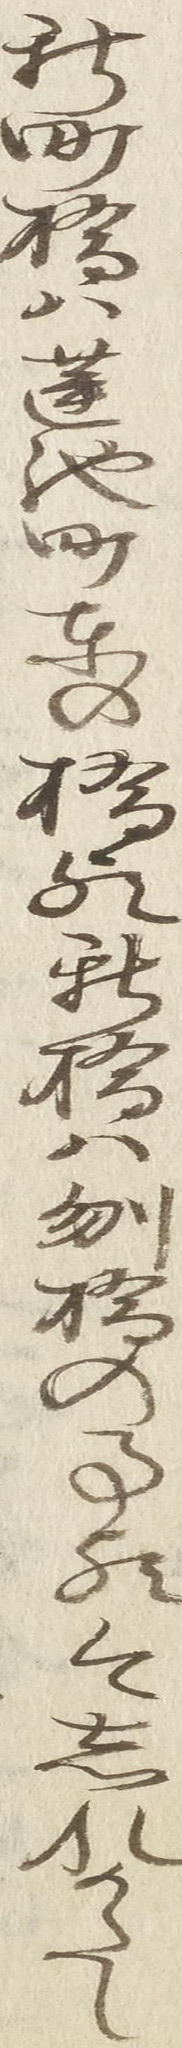新町橋は蓮池町東の橋歟新橋は刎橋の事歟今しれかたし
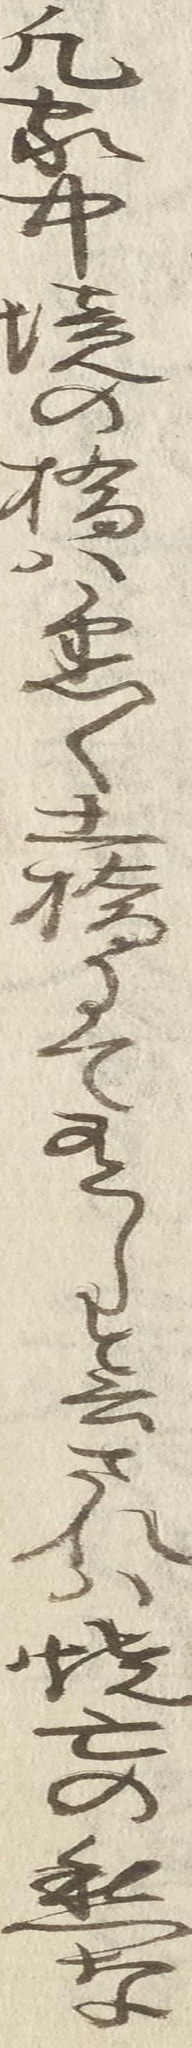凡家中境の橋は悉く土橋にて有しと云されは焼亡の愁な
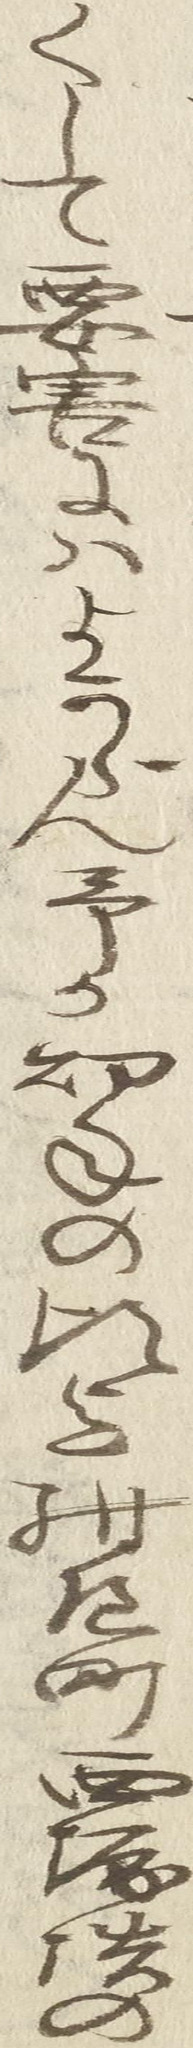くして要害にはよからん予か幼年の頃迄紺屋町西堀詰の
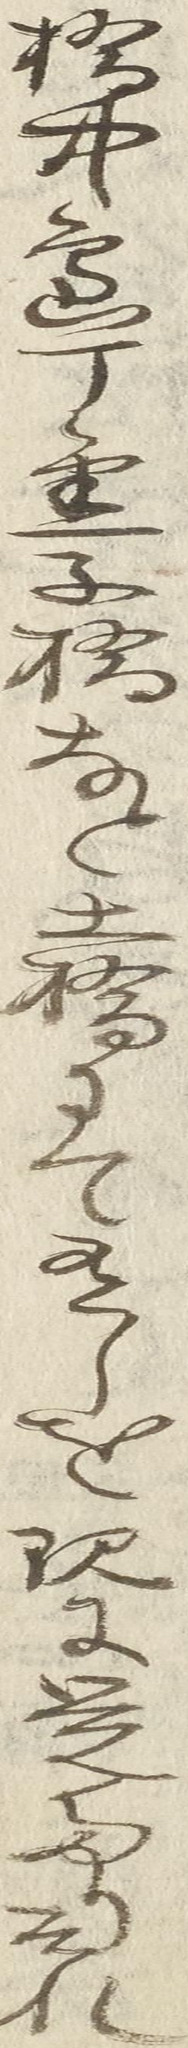橋中島丁金子橋なと土橋にて有しを現に覚たりそれ
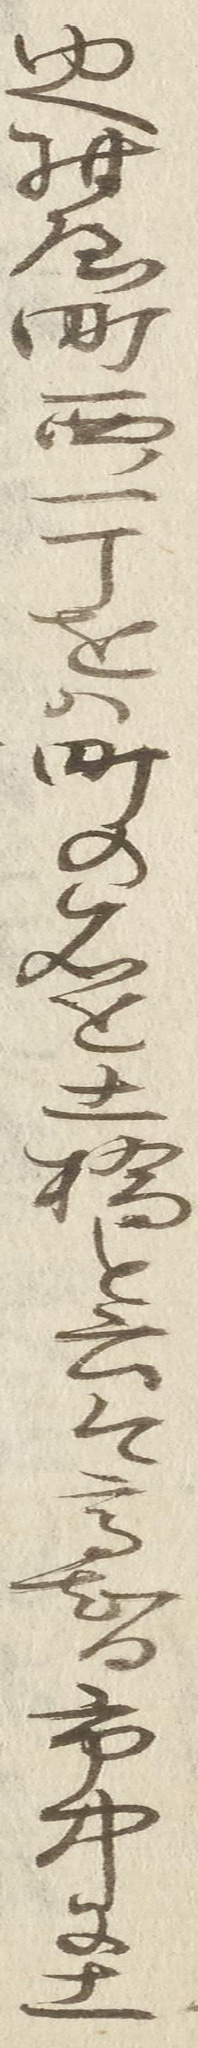ゆへ紺屋町西の一丁をは町の名を土橋と云今高知る市中に土
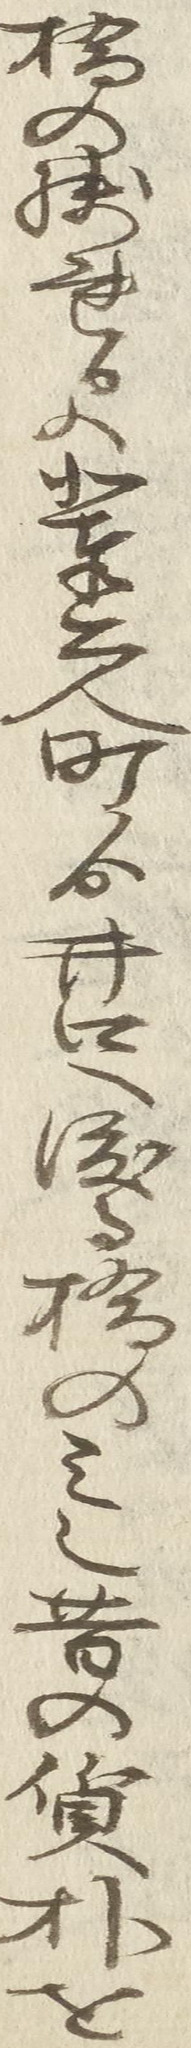橋の残れるは北奉公人町より井口へ渡る橋のみ也昔の質朴を
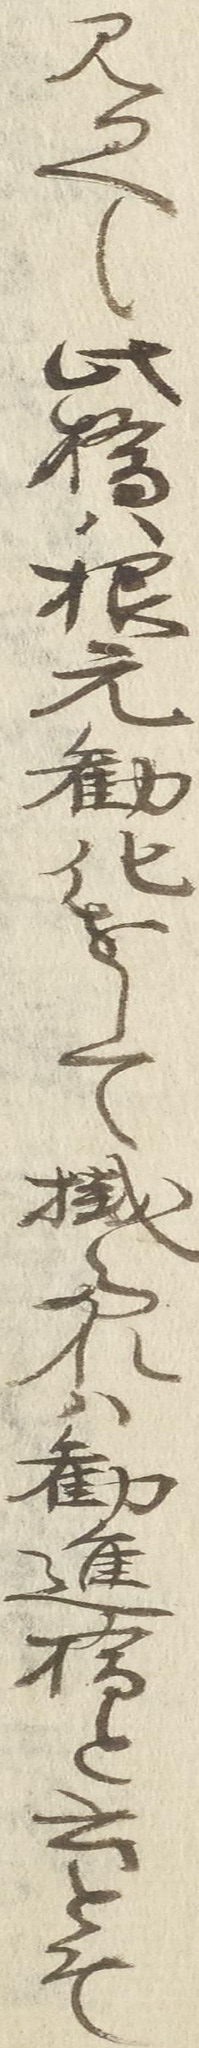見るヘし此橋は根元勧化をして掛たれは勧進橋と云とそ
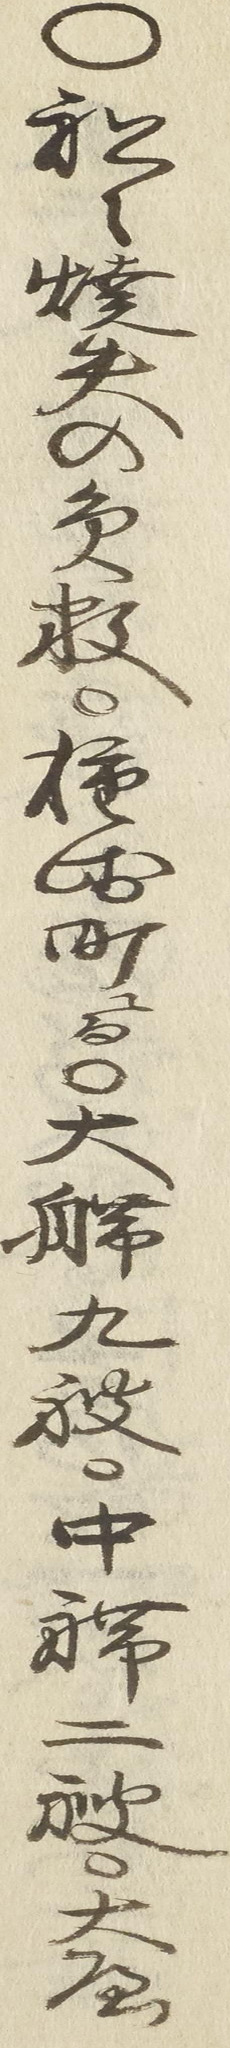〇船の焼失の員数◦種崎町にて◦大艜九艘◦中艜二艘◦大屋

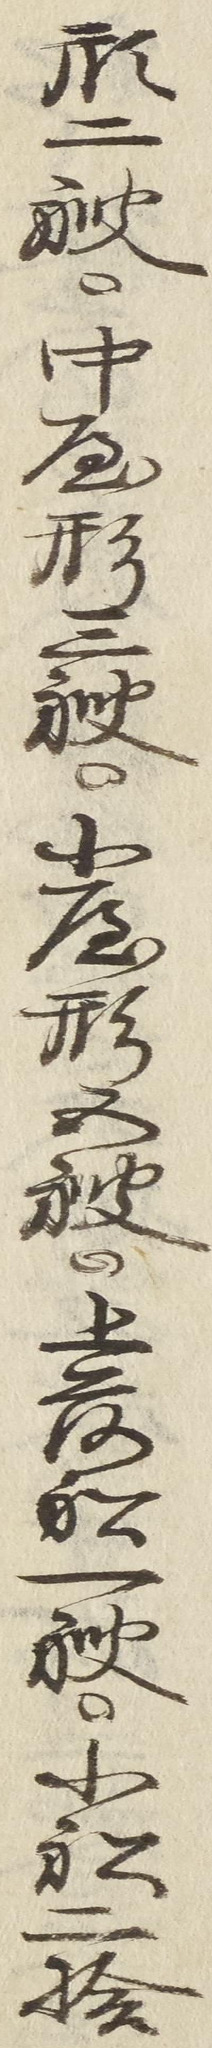形二艘◦中屋形三艘◦小屋形五艘◦上荷艘一艘◦小船二拾
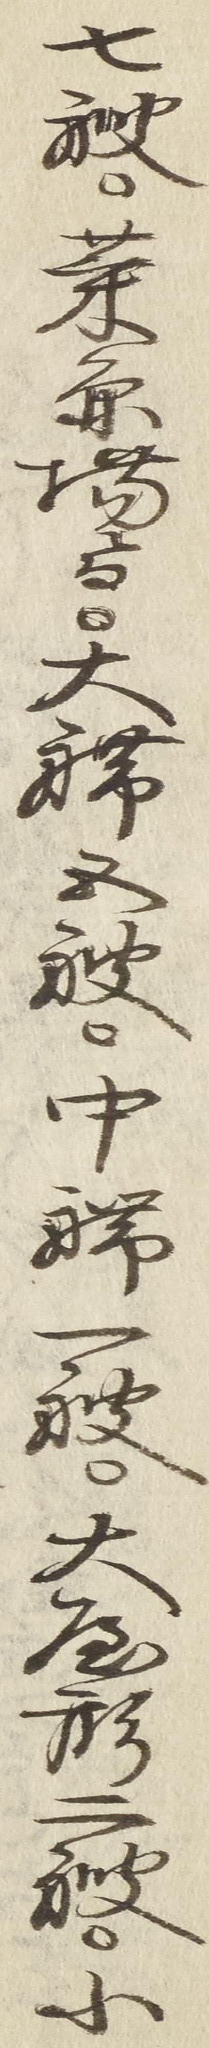七艘◦菜円場にて◦大艜五艘◦中艜一艘◦大屋形二艘◦小
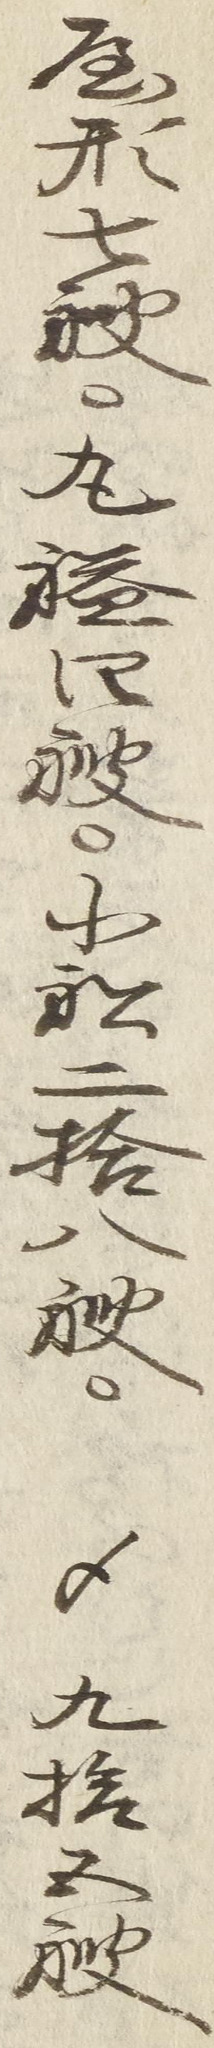屋形七艘◦丸艗四艘◦小船二拾八艘◦〆九拾五艘
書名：地震記　上
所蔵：東京大学地震研究所図書室 Earthquake Research Institute Library, The University of Tokyo, JAPAN
